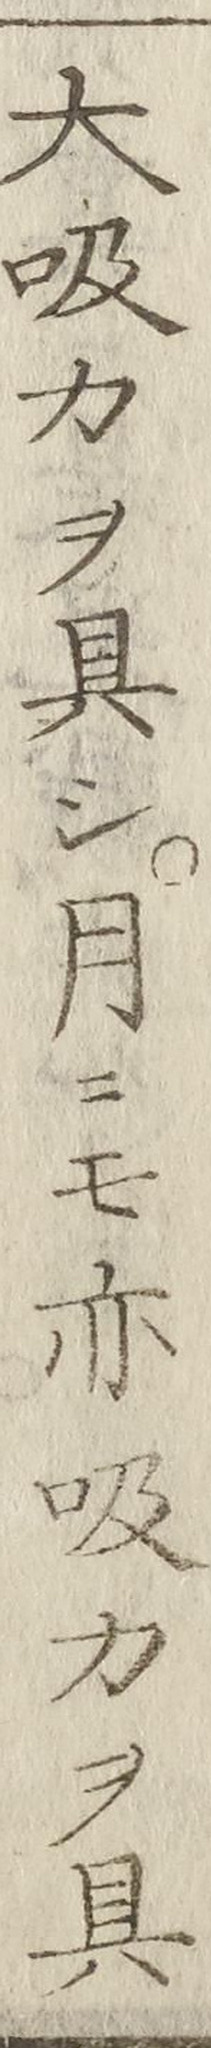大吸カヲ具シ。月ニモ亦吸カヲ具
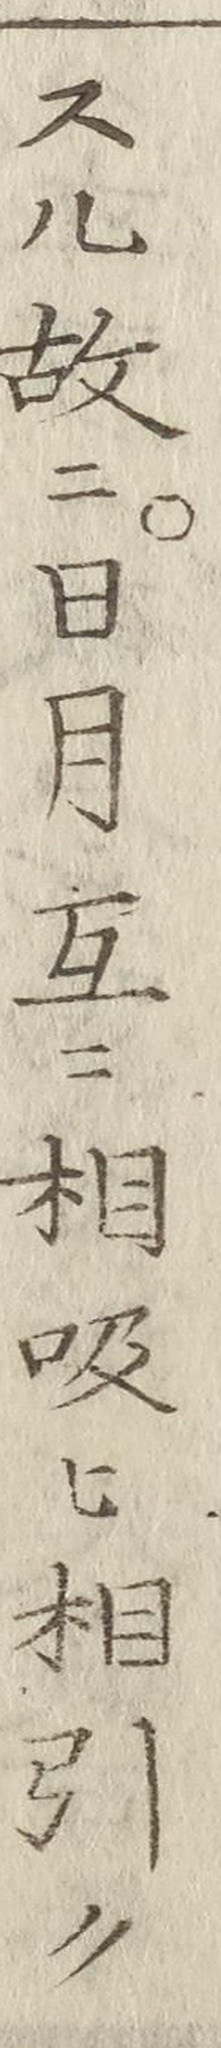スル故ニ。日月互二相吸ヒ相引ク
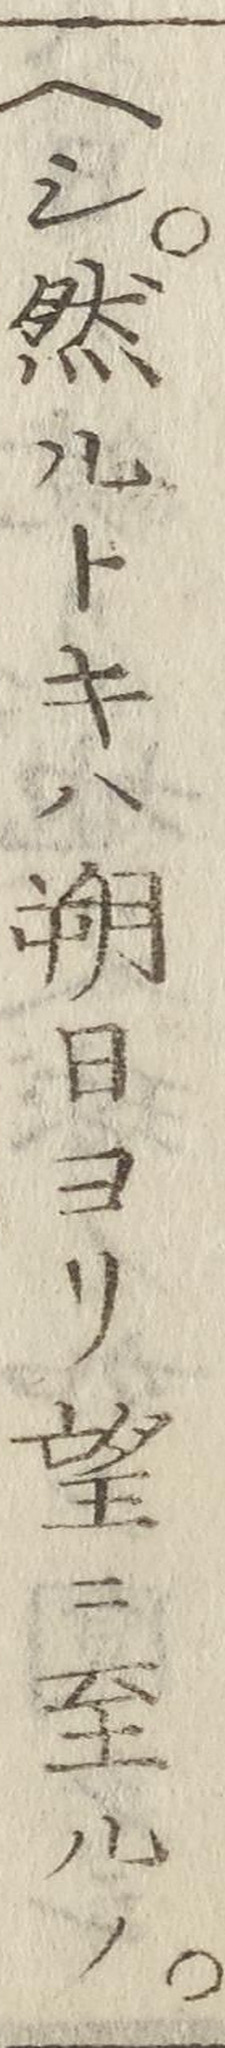ヘシ。然ルトキハ朔日ヨリ望ニ至ルノ。
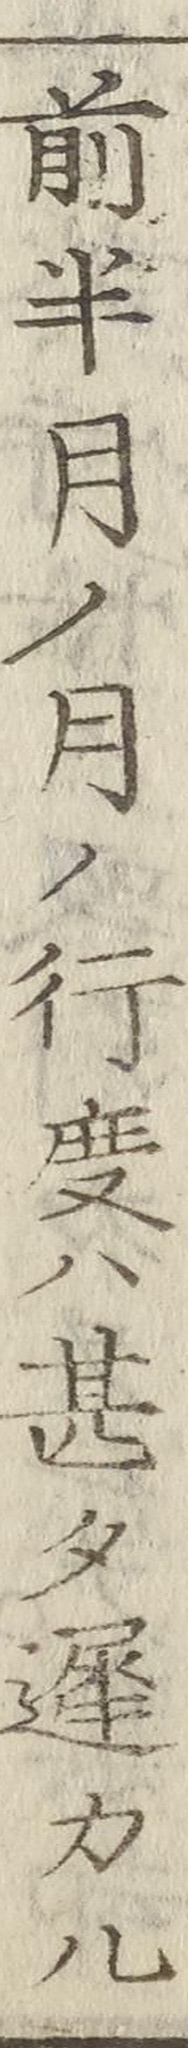前半月ノ月ノ行度ハ甚タ遅カル
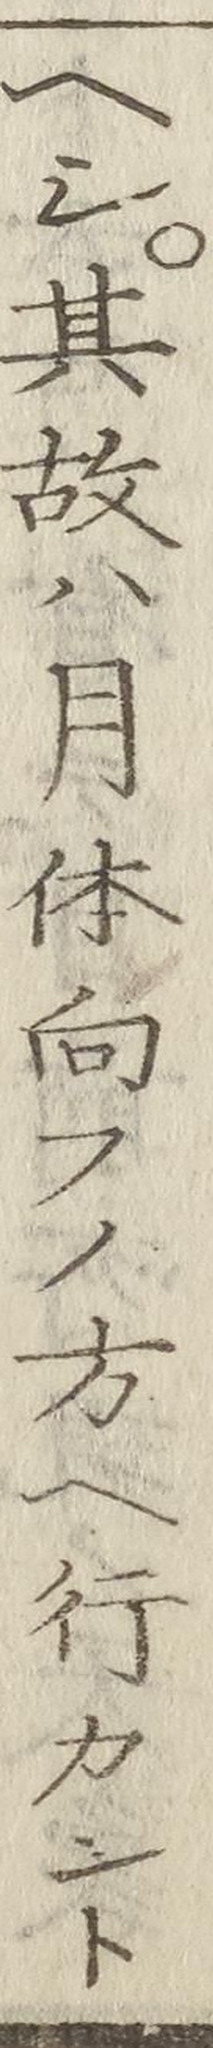ヘシ。其故ハ月体向フノ方ヘ行カント
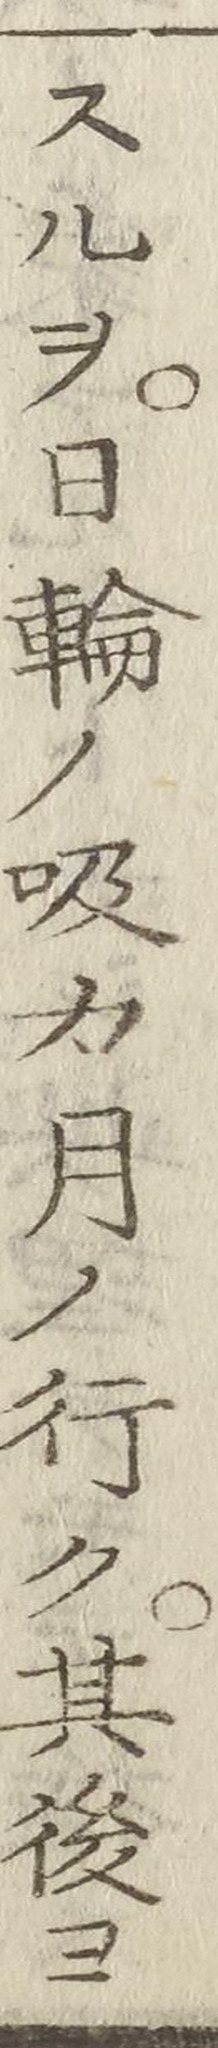スルヲ。日輪ノ吸カ月ノ行ク。其後ヨ
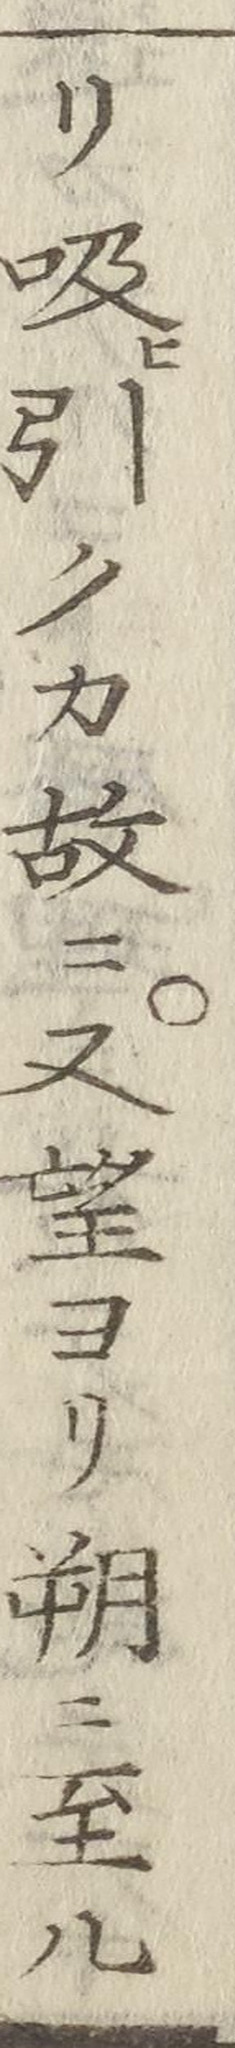リ吸引クカ故ニ。又望ヨリ朔ニ至ル
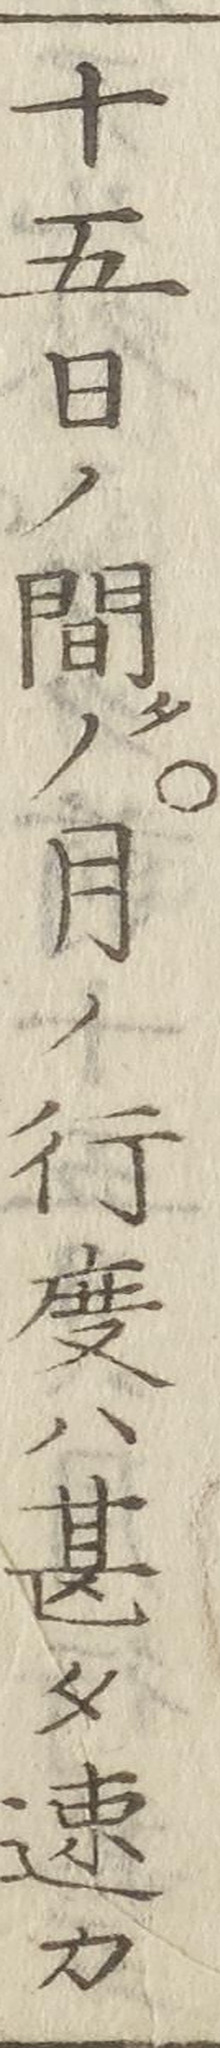十五日ノ間月ノ行度ハ甚タ速カ
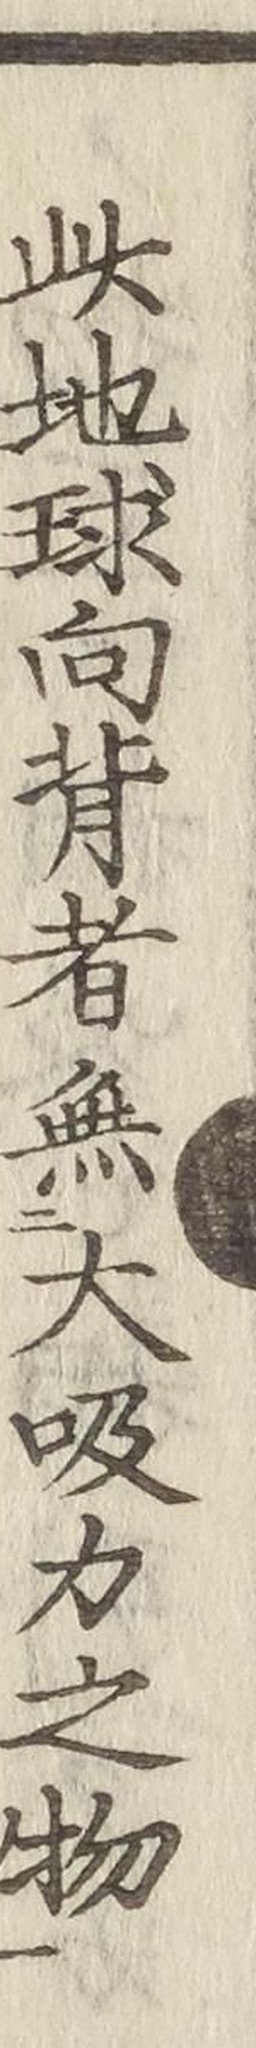此地球向背者無大吸カ之物
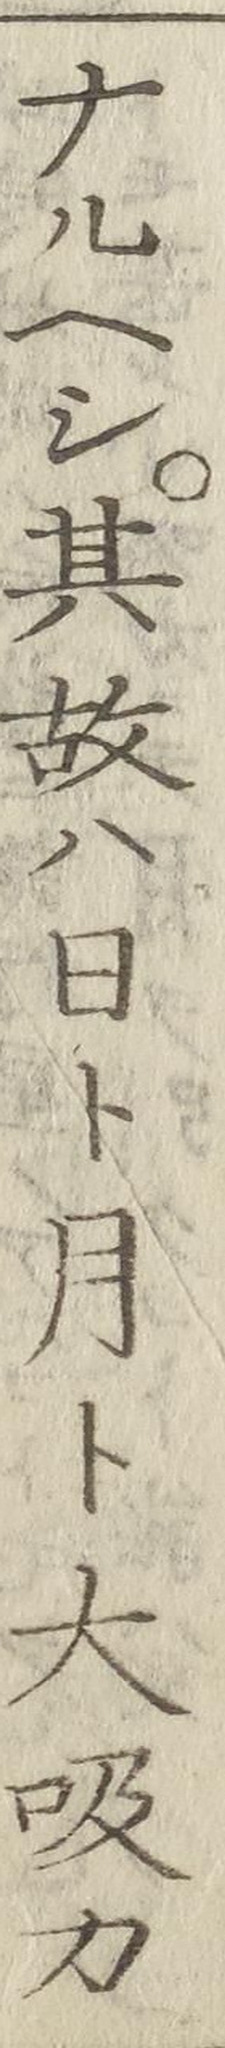ヘシ。其故ハ日ハ月ト大吸カ

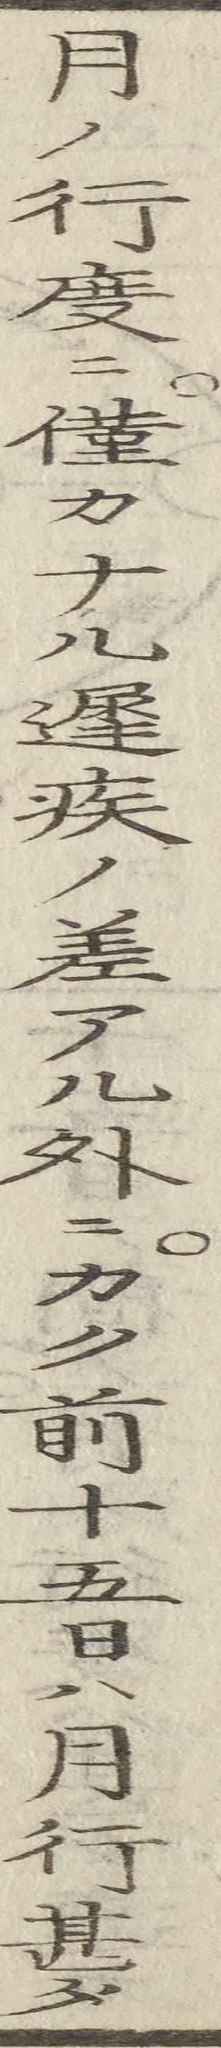月ノ行度ニ。僅カナル遅疾ノ差アル外ニ。カク前十五日ハ月行甚タ
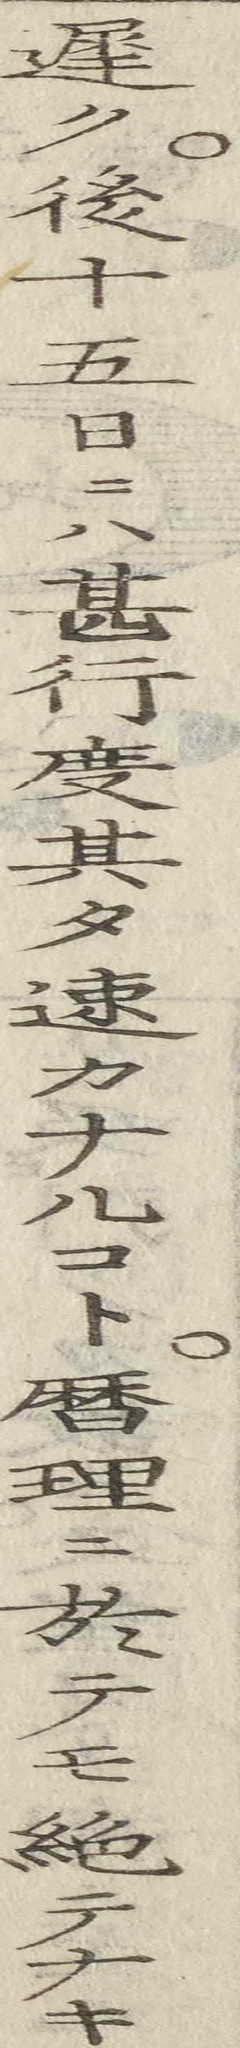遅ク。後十五日ニハ甚行度其タ速カナルコト。暦理ニ於テモ絶テナキ
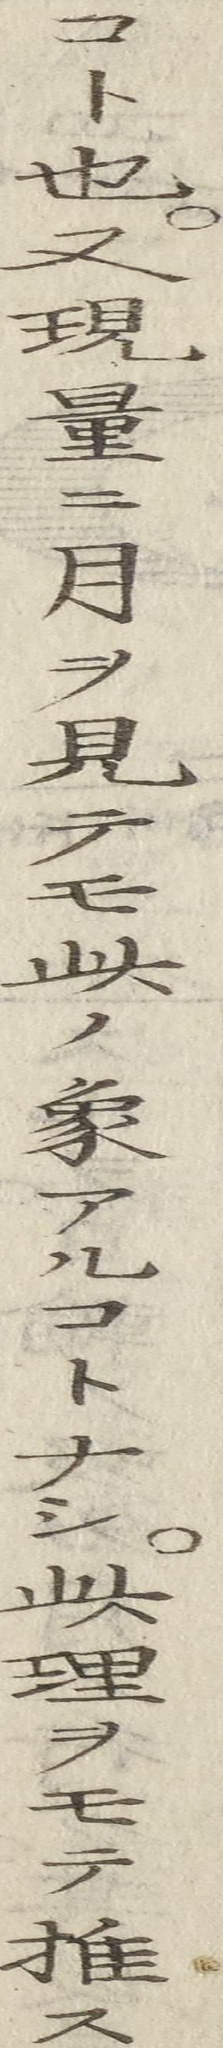コト也。又現量ニ月ヲ見テモ此ノ象アルコトナシ。此理ヲモテ推ス
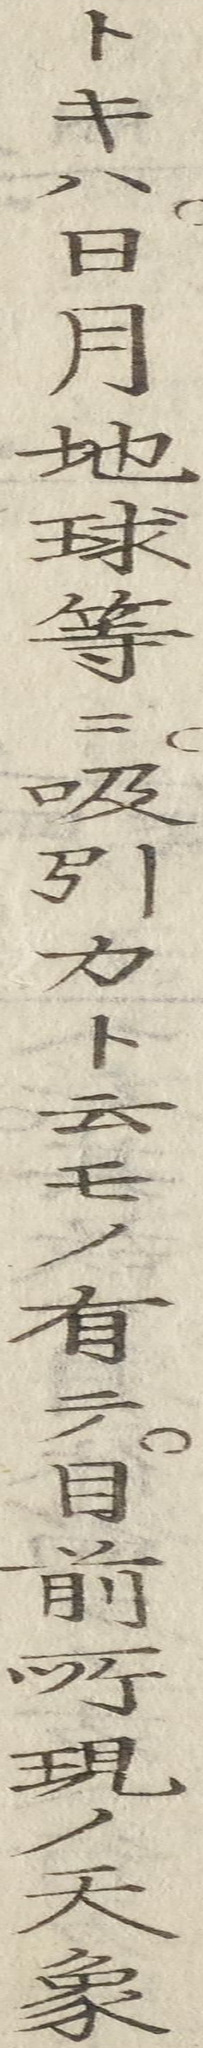トキハ。日月地球等ニ。吸引カト云モノ有テ。目前所現ノ天象
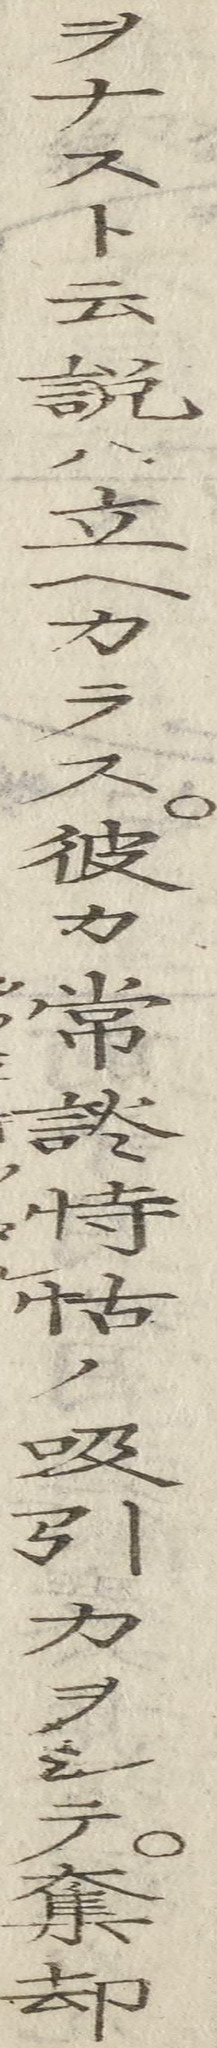ヲナスト云説ハ立ヘカラス。彼カ常談恃怙ノ吸引カヲシテ。奪却
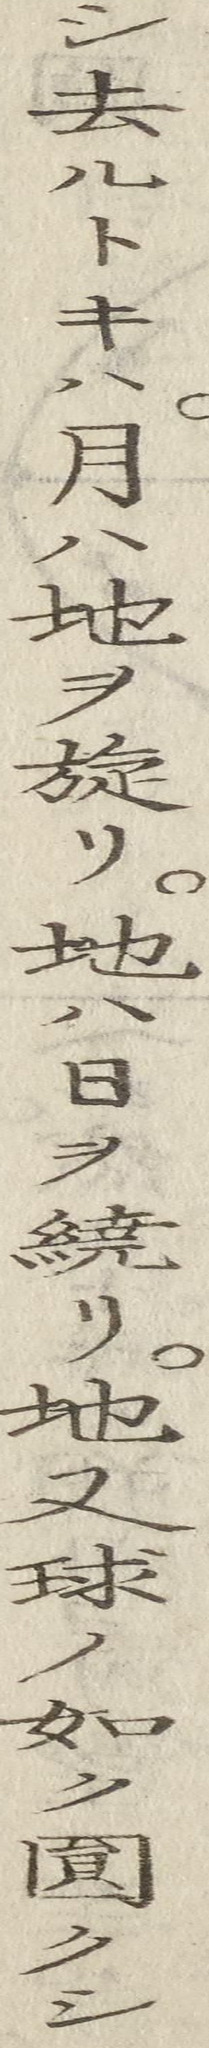シ去ルトキハ。月ハ地ヲ旋リ。地ハ日ヲ繞リ。地又球ノ如ク円クシ
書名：護法新論　中
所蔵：東京大学地震研究所図書室 Earthquake Research Institute Library, The University of Tokyo, JAPAN
